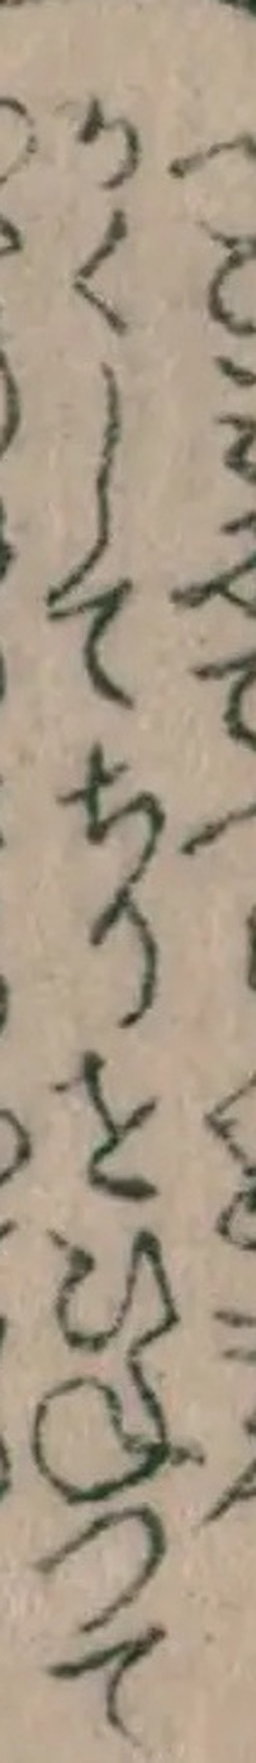かくしてちりをひねつて
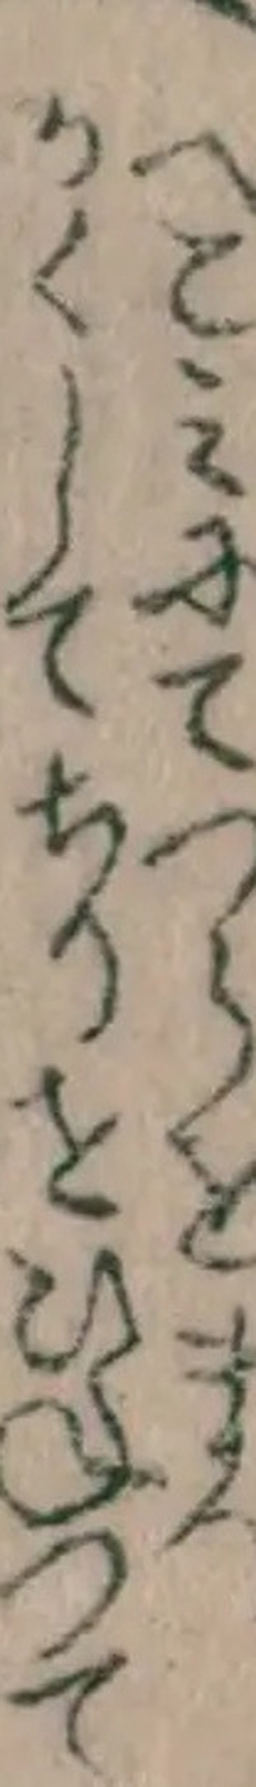かくしてちりをひねつて
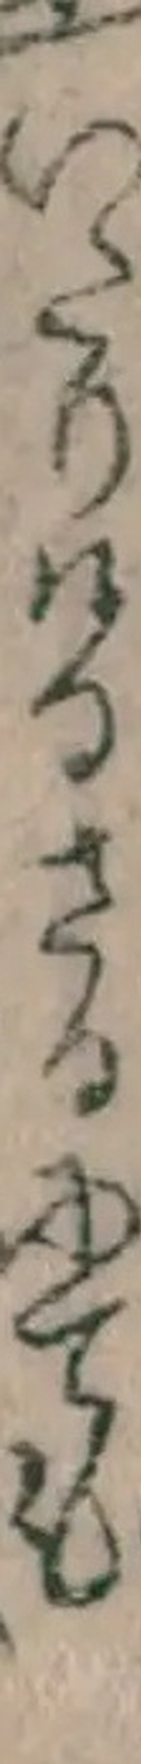いたりけるさるにても
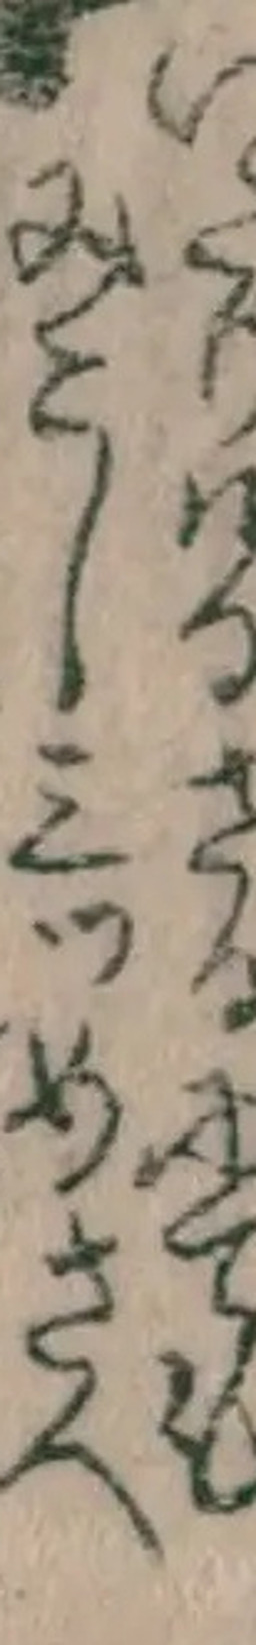みこし三つめさへ
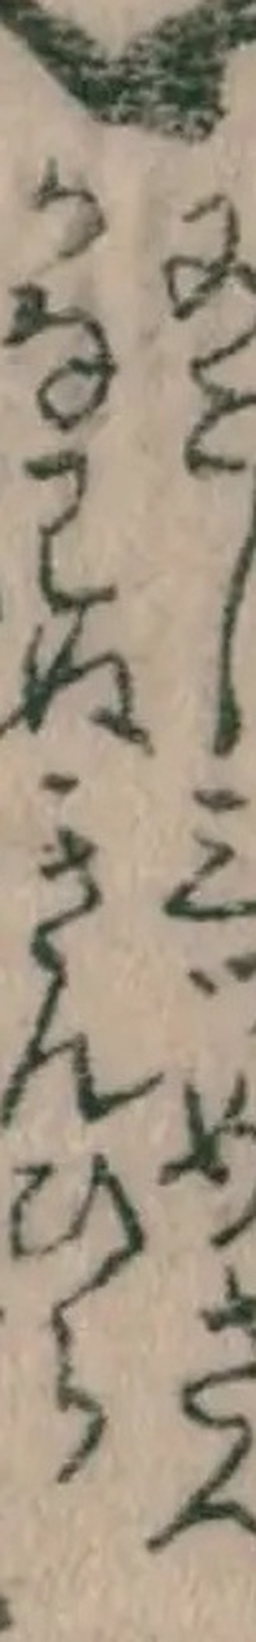かなわぬきんひら
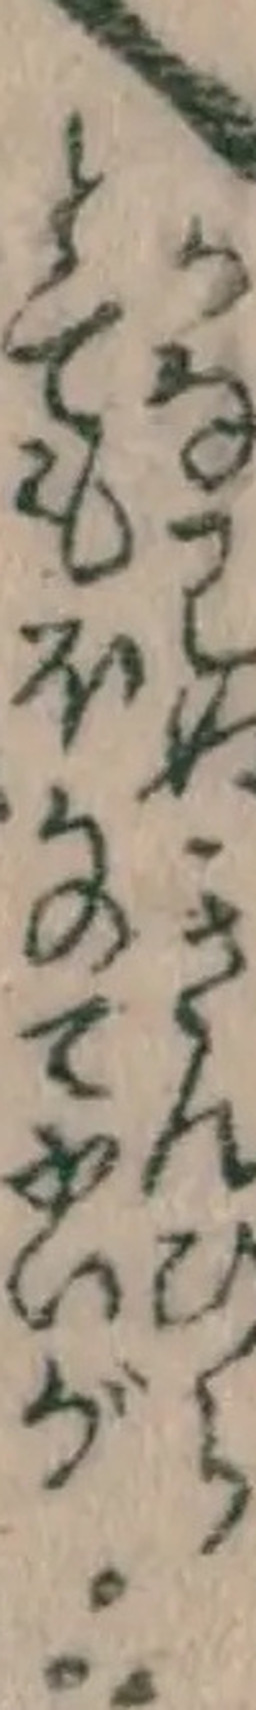とてもほなてやいが
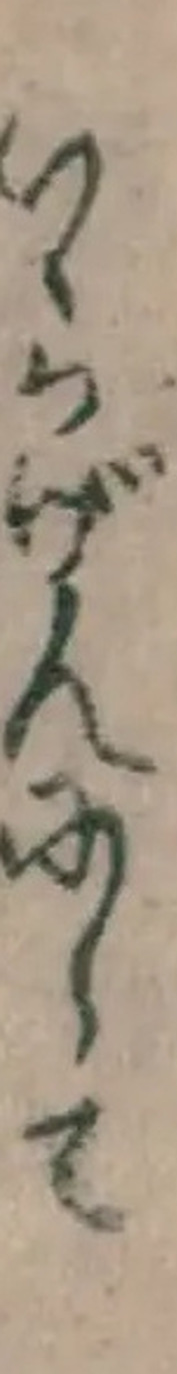いゝかげんにして
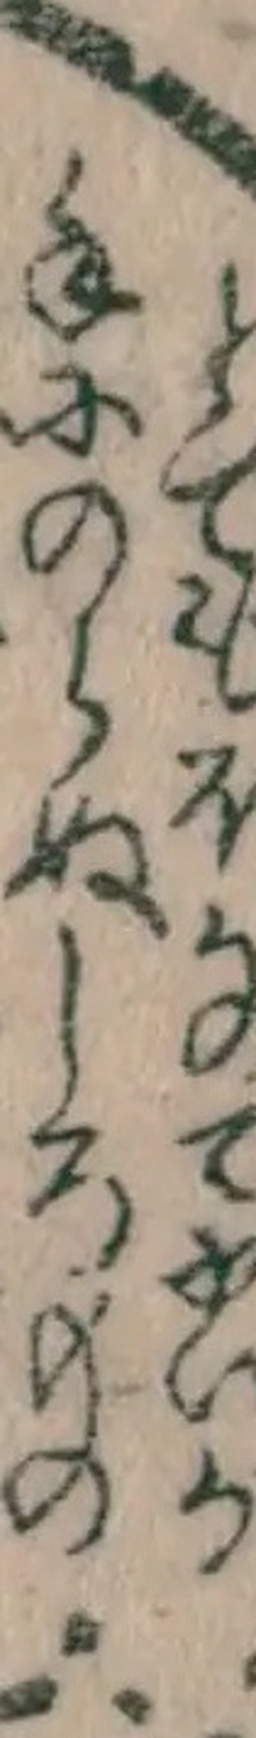手にのらぬしろもの
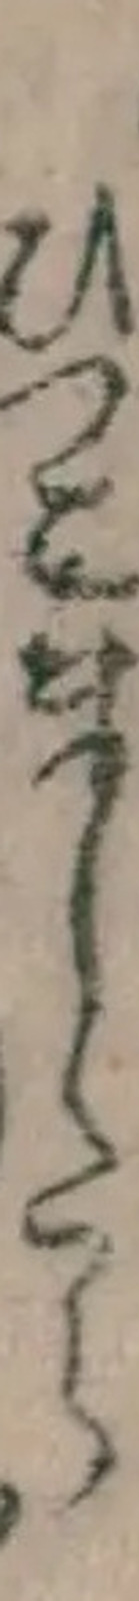ひつこましたら
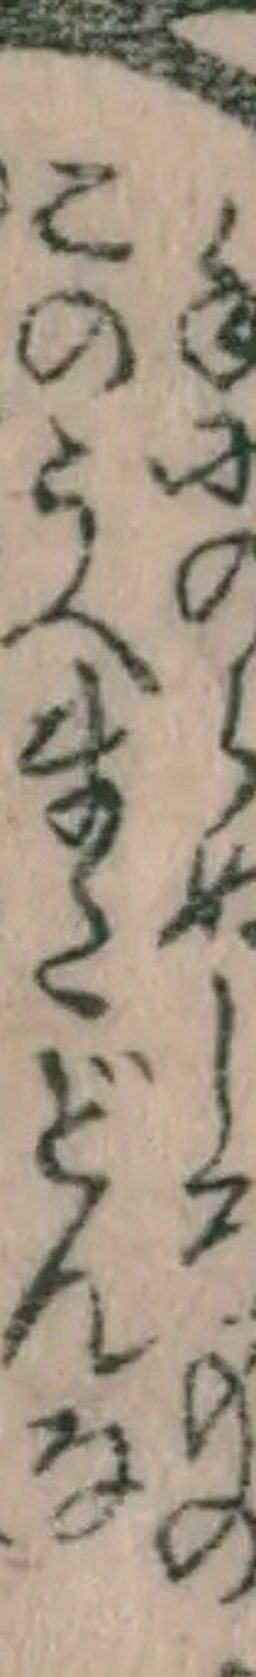このうへまたどんな
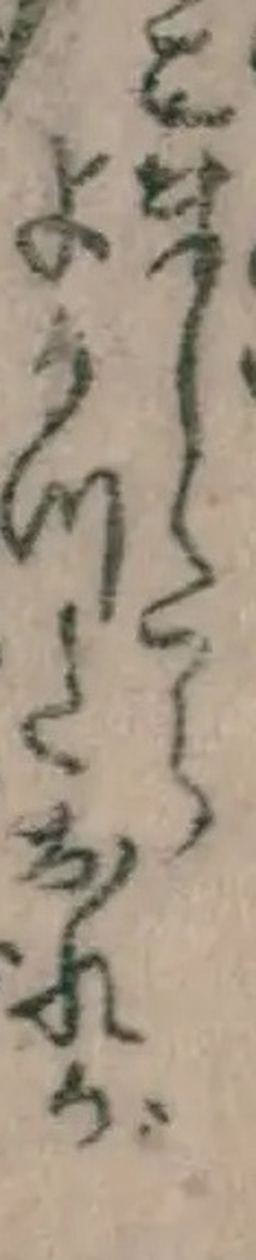よかつたおれが
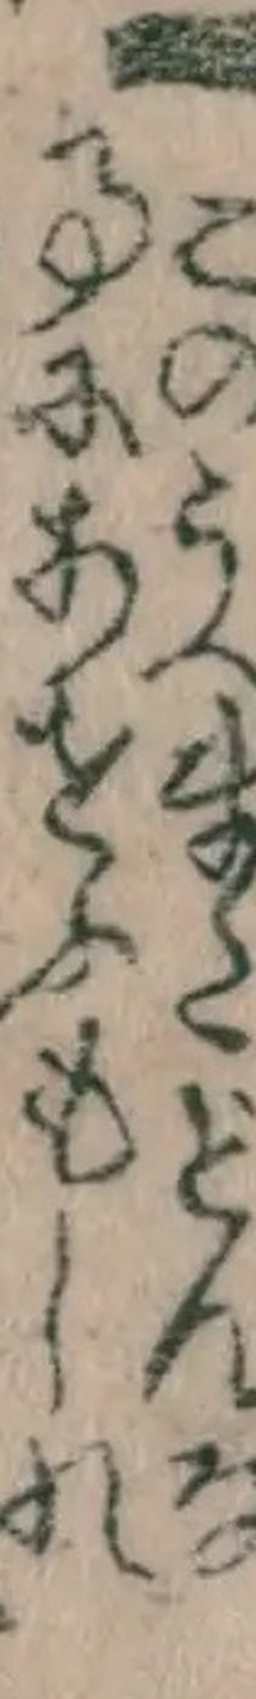事にあをふもしれ
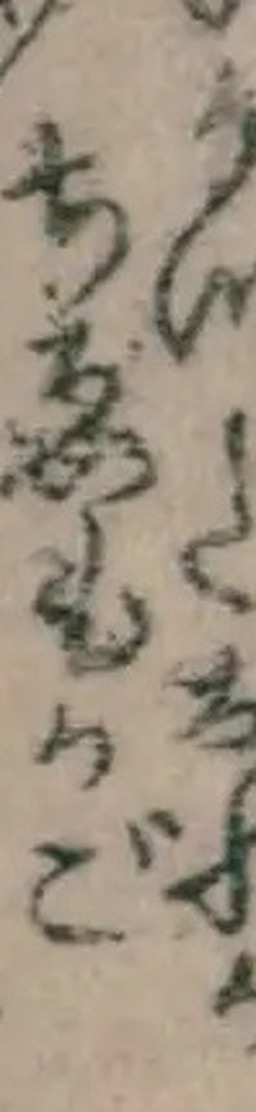ちゑもかご
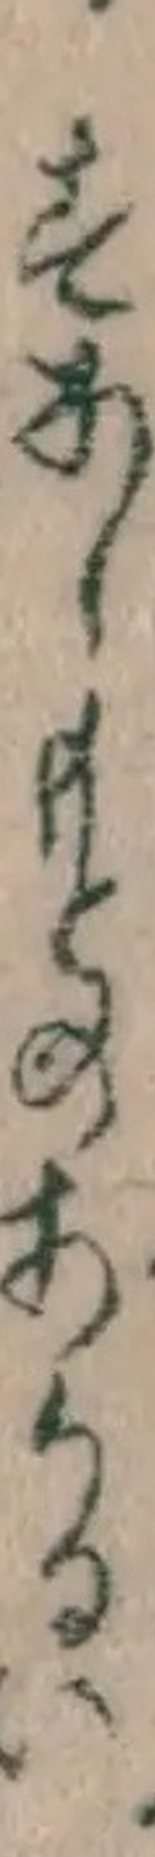ずあしもとのあかるい
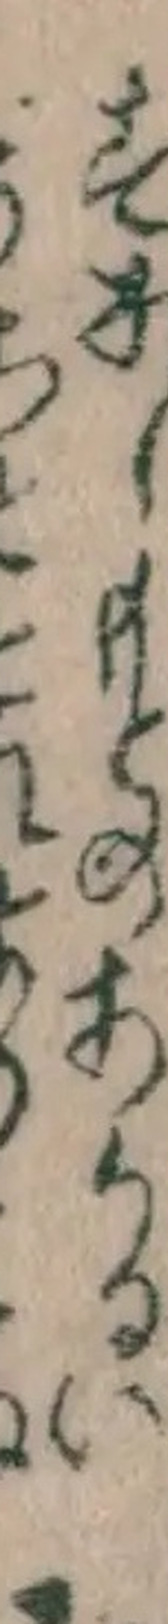ずあしもとのあかるい
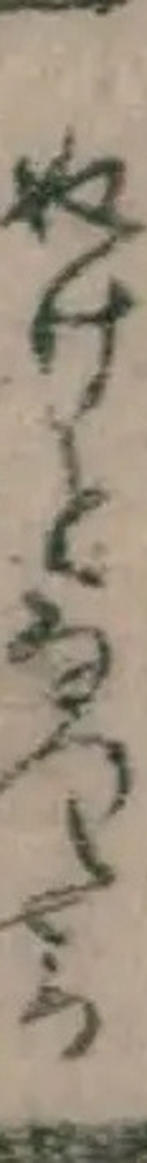ぬけとなつたか
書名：信有奇怪会
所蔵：国立国会図書館 National Diet Library, JAPAN
